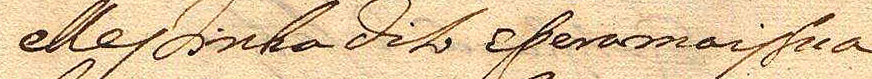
elles tinha dito E pera mais sua
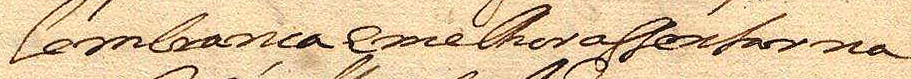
lembrança E melhor assentar na
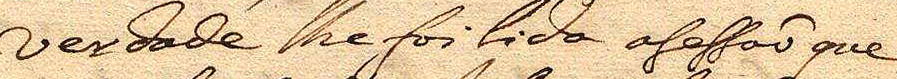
verdade lhe foi lida a sessaõ que
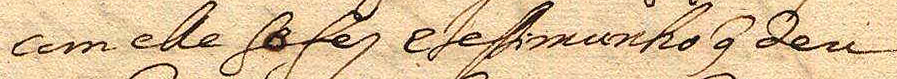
com elle s_ fez e testemunho q̄ deu
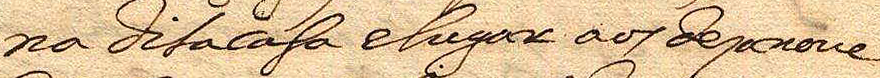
na dita casa e lugar aos dezanoue
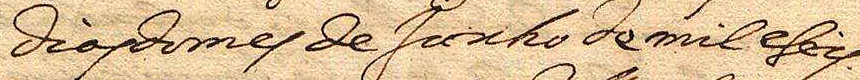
dias do mes de Junho de mil e seis
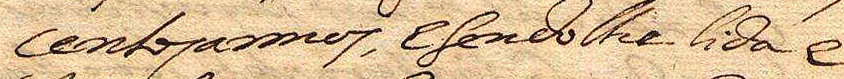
çentos annos, E sendolhe lida E
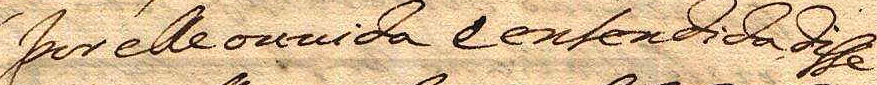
por elle ouuida e entendida disse
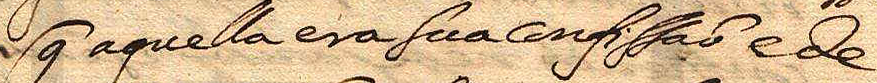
q̄ aquella era sua confissaõ e de
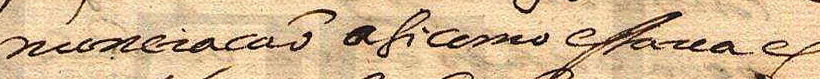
nunciaçaõ asi como estaua es
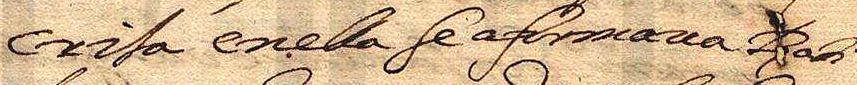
crita e nella se afirmaua Rati
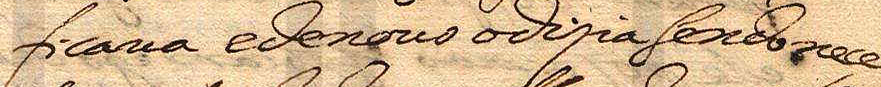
ficaua e de nouo o dizia sendo neçe
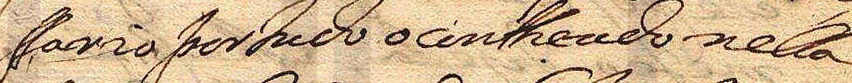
ssario por tudo o contheudo nella
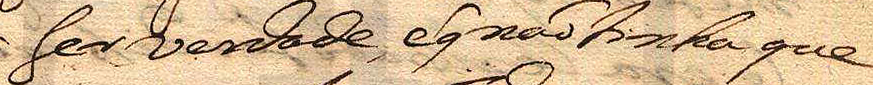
ser verdade, e q̄ naõ tinha que
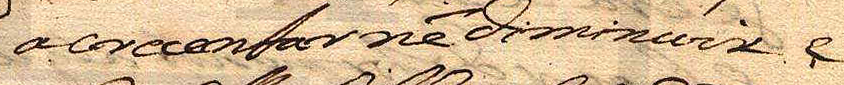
acrecentar nē diminuir e
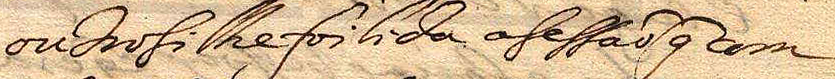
outrosi lhe foi lida a sessaõ q̄ com
